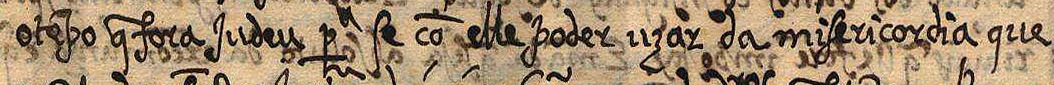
o tēpo q̄ fora Judeu ꝑa se cō elle poder uzar da misericordia que
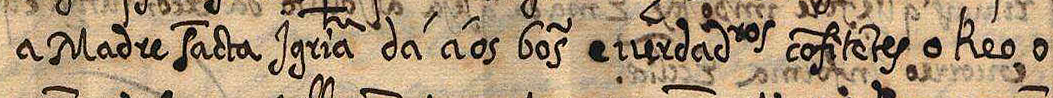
a Madre Sācta Jgrīa da aos bōs e uerdadros cōfitētes o Reo o
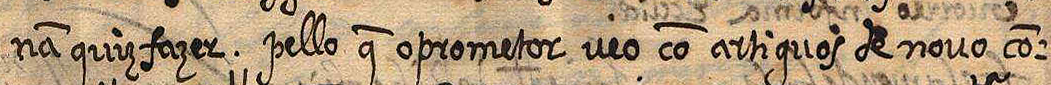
nā quiz fazer. pello q̄ o prometor ueo cō artiguos de nouo cō
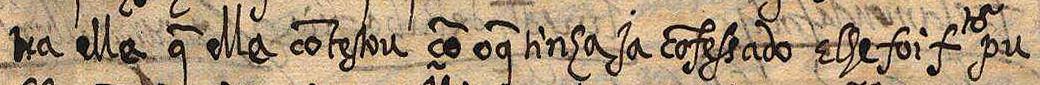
tra ella q̄ ella cōfessou cō o q̄ tinha Ja cōfessado E lhe foi fta pu
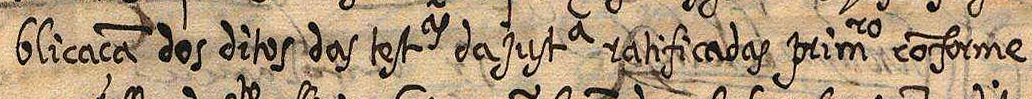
blicaçā dos ditos das testas da Justa ratificadas primro cōforme
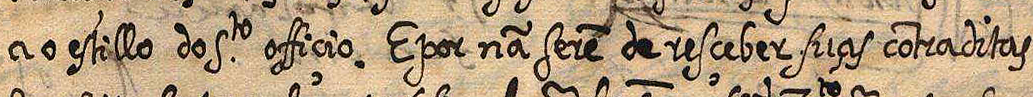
ao estillo do s.to officio. E por nā serē de resceber suas cōtraditas
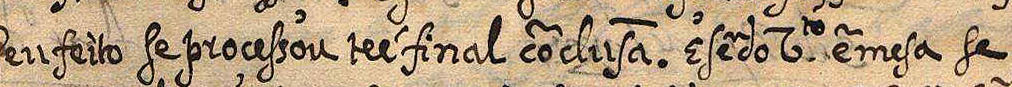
seu feito se processou teé final cōclusa. E sēdo v.to ē mesa se
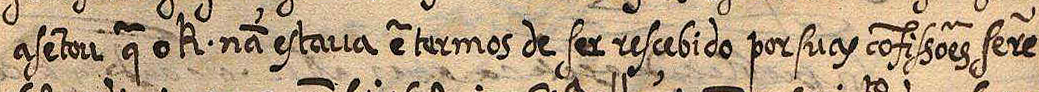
asētou q̄ o R. nā estaua ē termos de ser rescebido por suas cōfissões serē
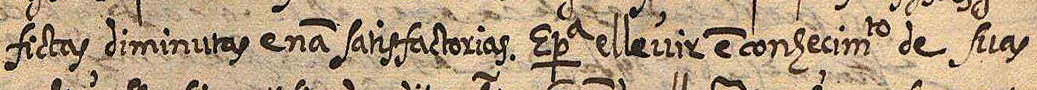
fictas diminutas e nā satisfactorias. E ꝑa elle uir ē conhecimto de suas
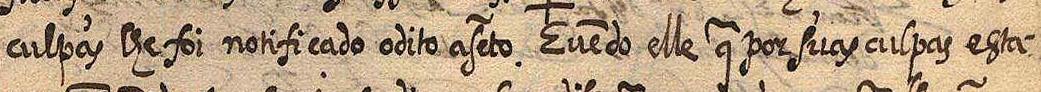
culpas lhe foi notificado o dito ase̅to E ue̅do elle q̅ por suas culpas esta
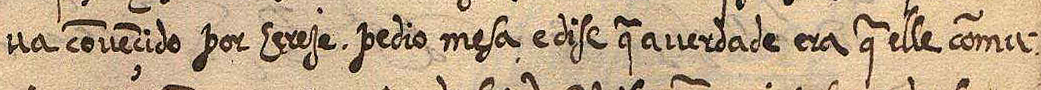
ua cōue̅cido por hereje. pedio mesa e dise q̄ a uerdade era q̄ elle cōmu
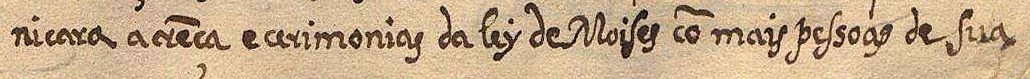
nicara a crēça e cerimonias da ley de Moises co̅ mais pessoas de sua
